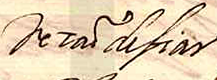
rezaõ de fiar
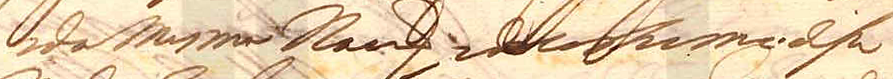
e da Mesma Naçaõ, e do costume disse
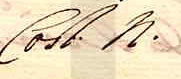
Cost. N.
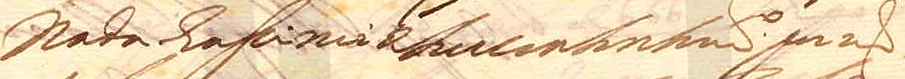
Nada E assinei de seu consentimento per naõ
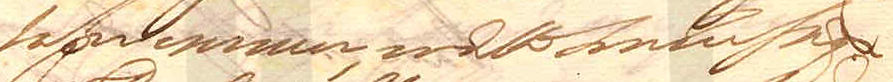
saber escreuer, e o ditto Senhor Inq.or
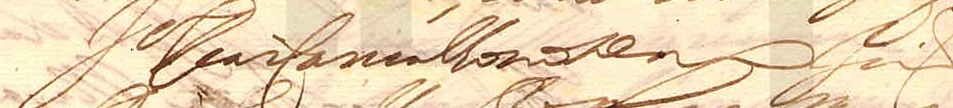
J.o Diaz Carualho noto Joaõ
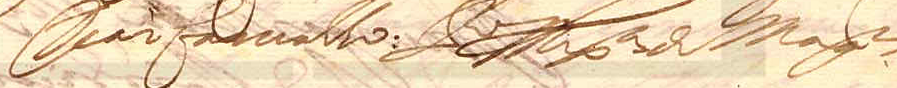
Diaz Carualho: P.o Mexa de Maga.es
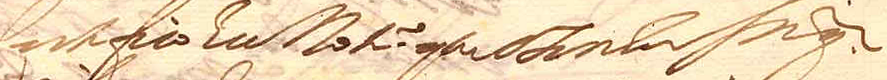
Certifico Eu Not.ro que o Senhor Inq.or
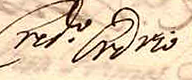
Cred.o Ordrio
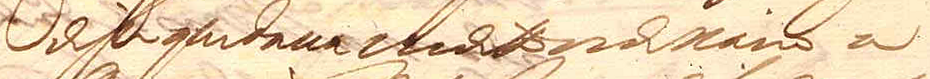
disse que daua creditto ordinario a
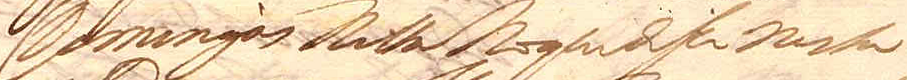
Domingas Netta no que disse nesta
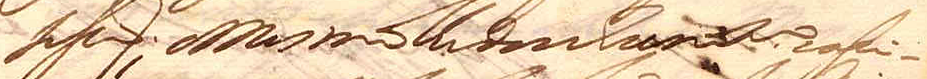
sessaõ; o mesmo lhe dou Eu not.ro e assi
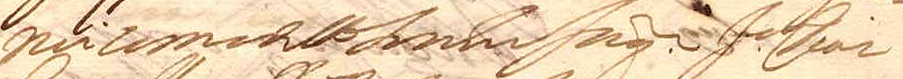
nei com o ditto Senhor Inq.or J.o Diaz
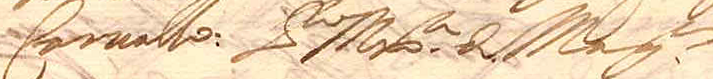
Carualho: P.o Mexa de Maga.es
